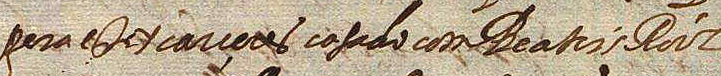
pera estes carçeres casado com Beatris Roiz
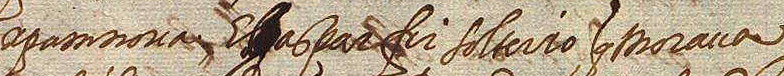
xpam noua, E Gaspar foi solteiro, q̄ moraua
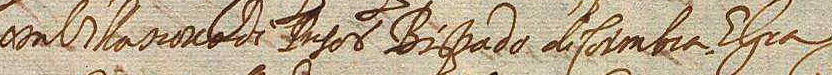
na Villa noua de Pusos Bispado de Coimbra, E Gra
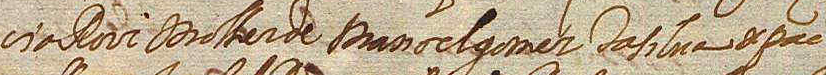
cia Roiz molher de manoel gomez da silua xpaõ
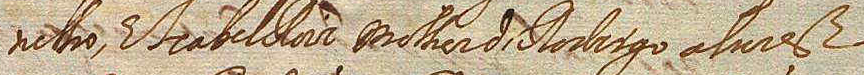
uelho, E Izabel Roiz molher de Rodrigo alures
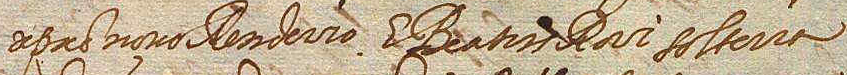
xpaõ nouo Rendeiro. E Beatris Roiz solteira
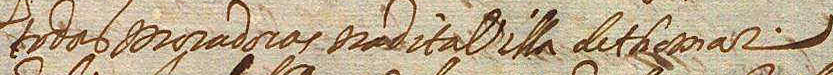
todas moradoras na dita Villa de thomar.
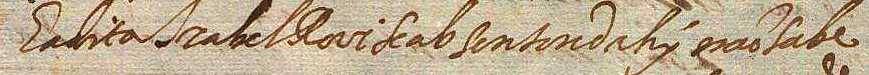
E a dita Izabel Roiz se absentou dahy naõ sabe
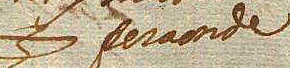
pera onde
